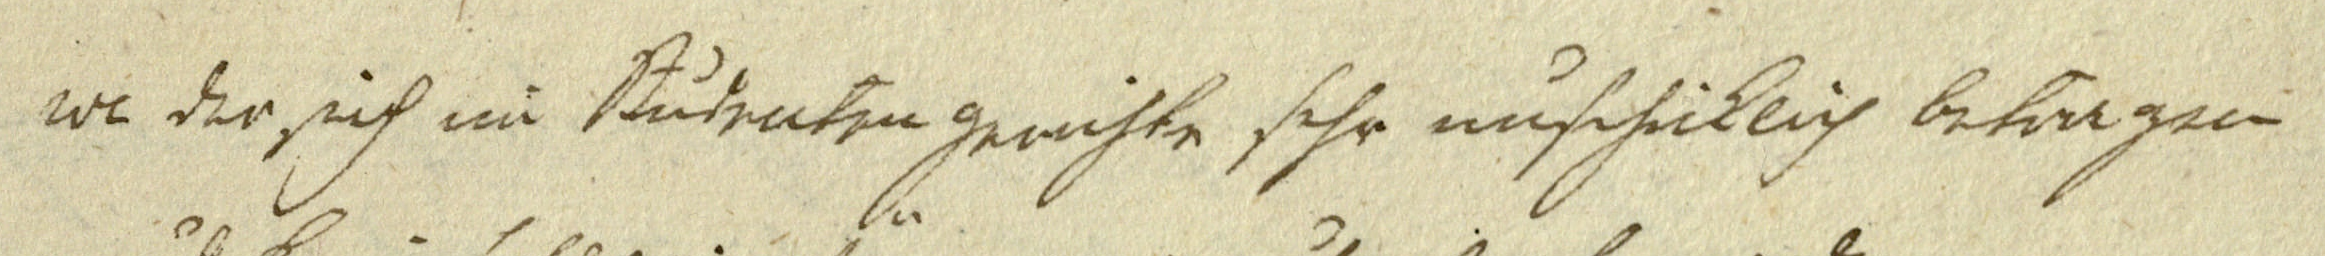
we der sich im Studentengerichte sehr unschicklich betragen
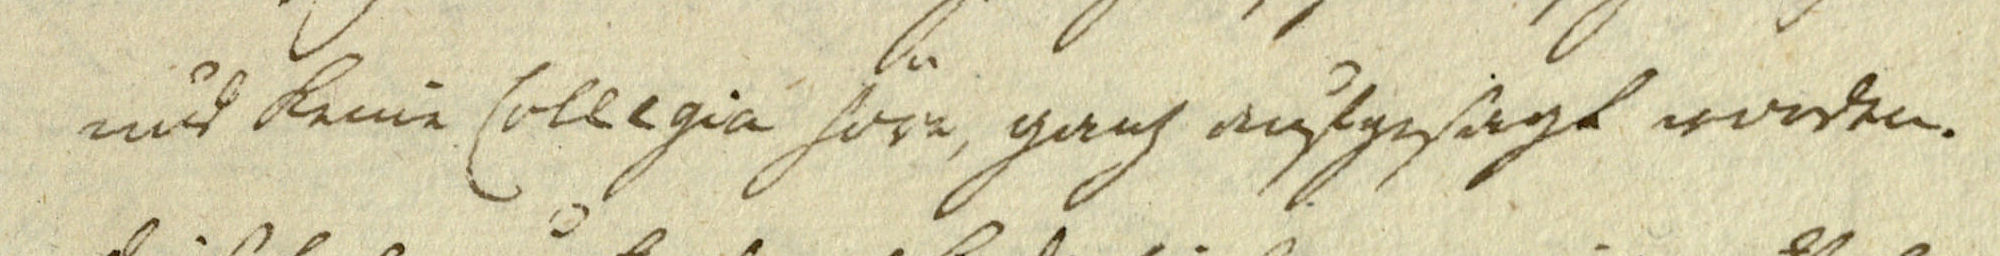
und keine Collegia höre, ganz aufgesagt worden.
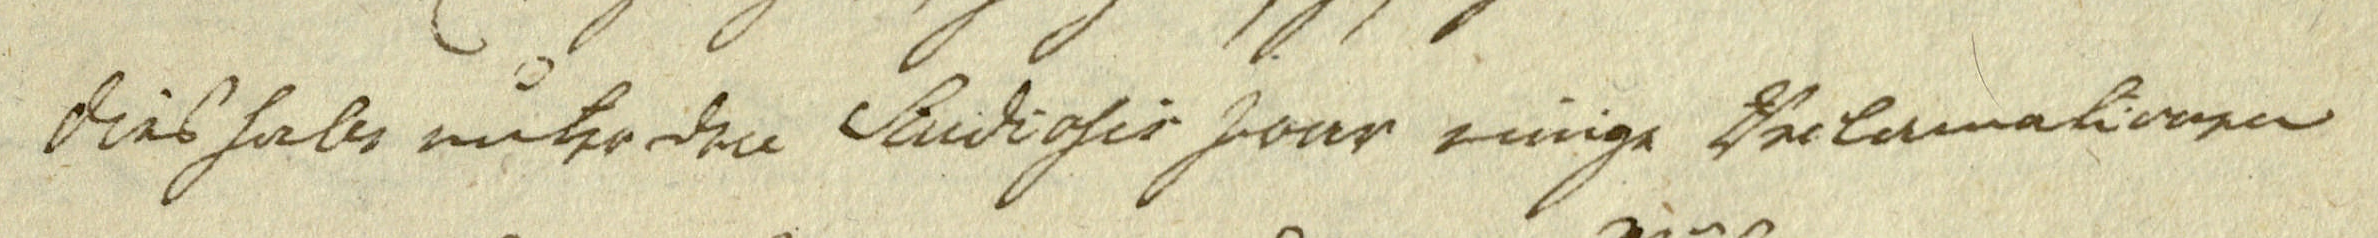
Dies habe unter den Studiosis zwar einige Reclamationen
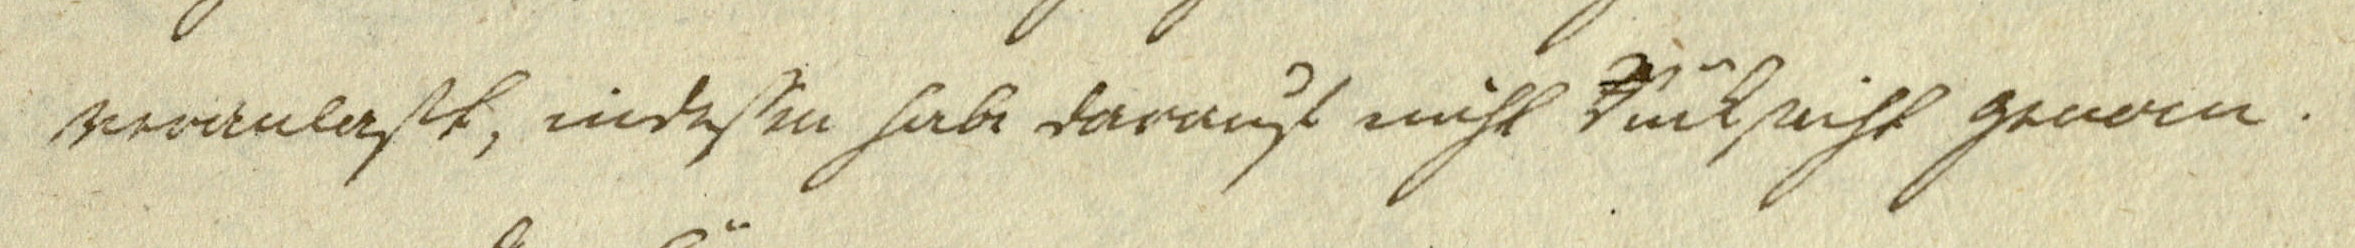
veranlaßt, indessen habe darauf nicht Rücksicht genom¬
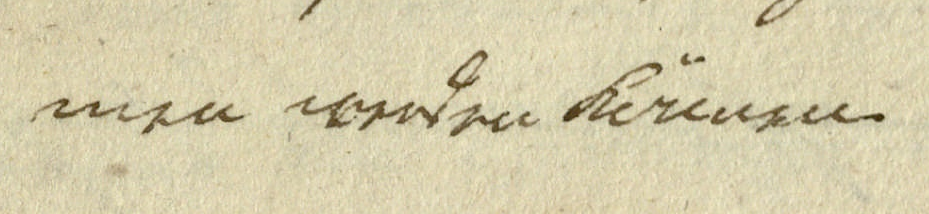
nen werden können.
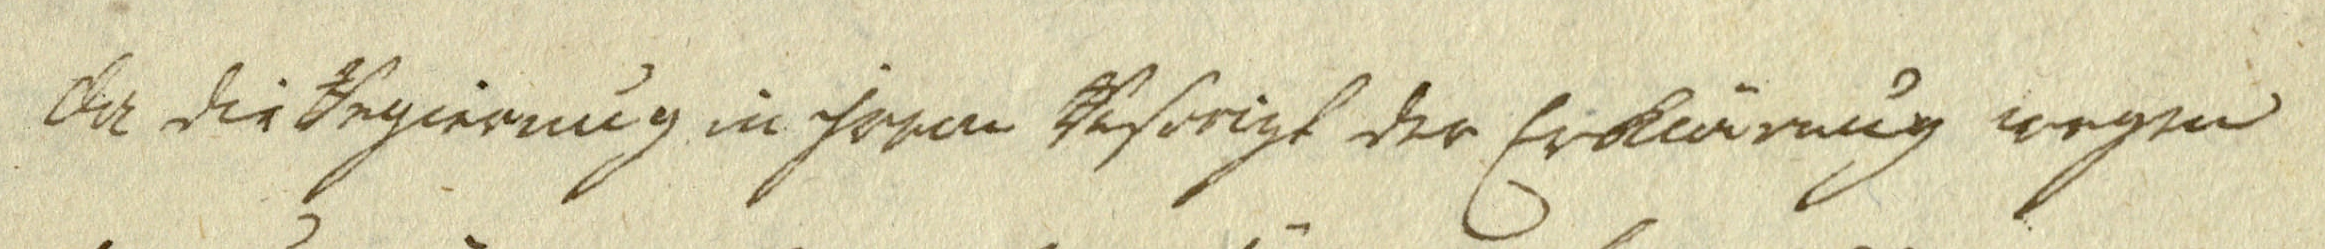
Da die Regierung in ihrem Rescript der Erklärung wegen
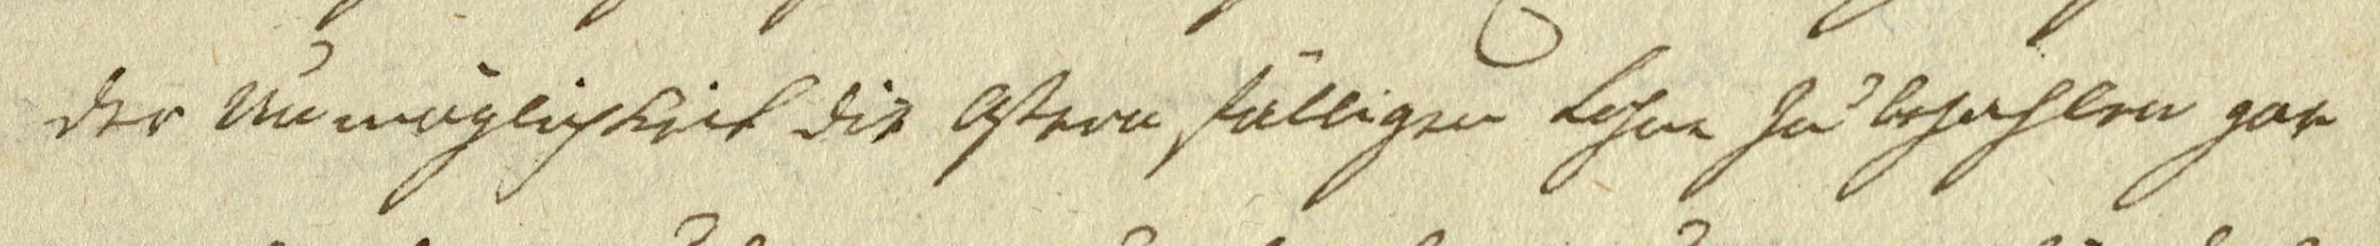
der Unmöglichkeit die Ostern fälligen Lohne zu bezahlen gar
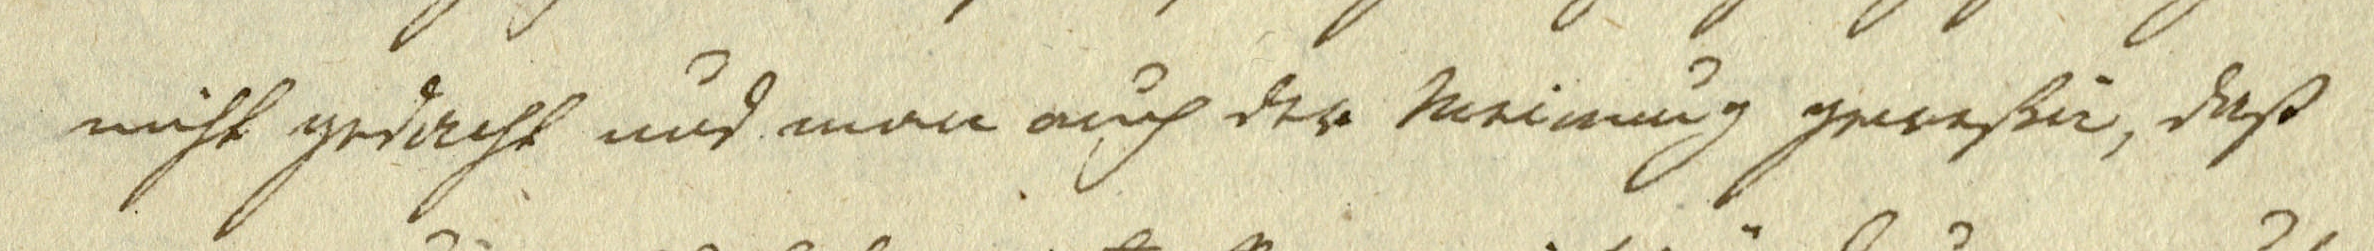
nicht gedacht und man auch der Meinung gewesen, daß
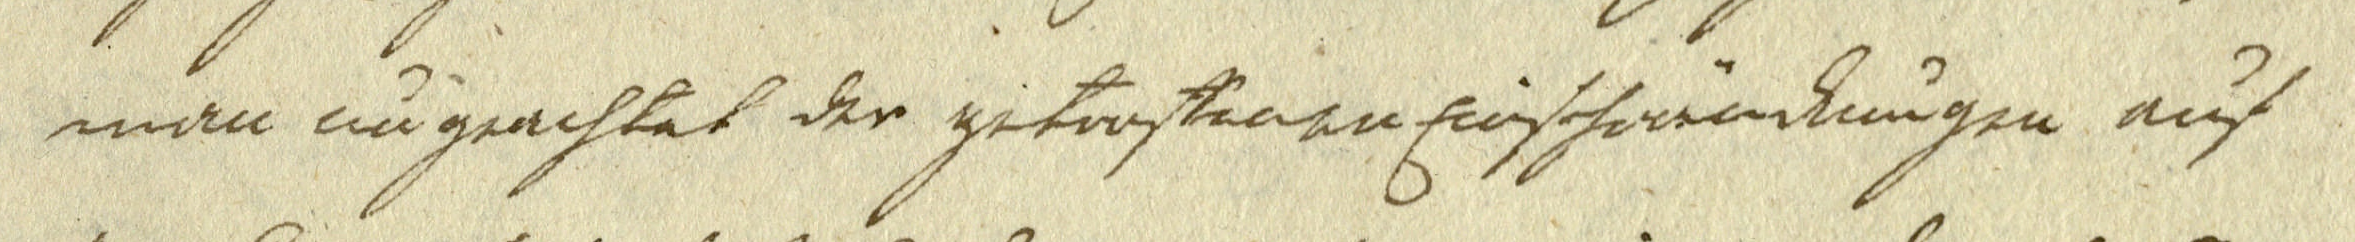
man ungeachtet der getroffenen Einschränkungen auf
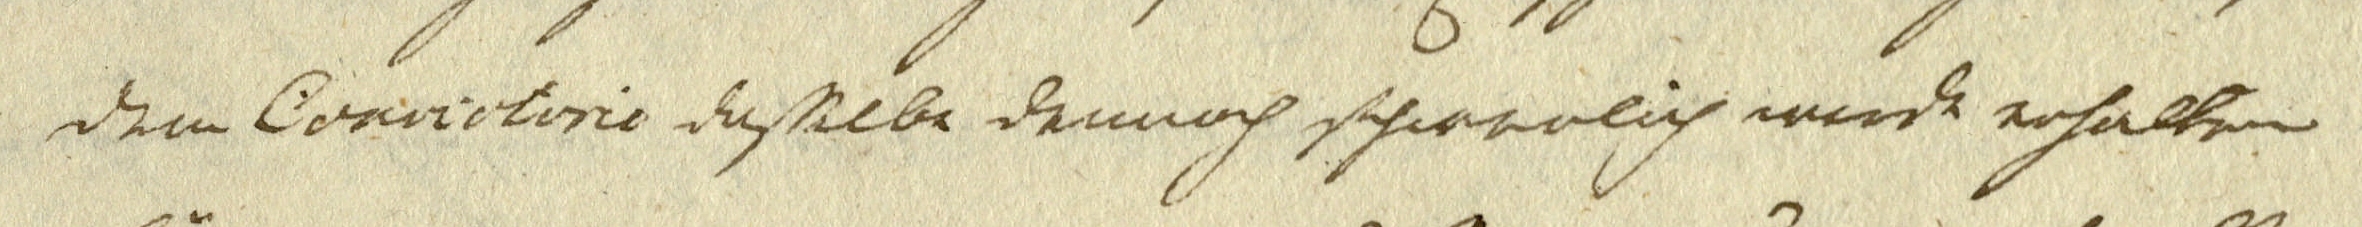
dem Convictorio dasselbe dennoch schwerlich werde erhalten
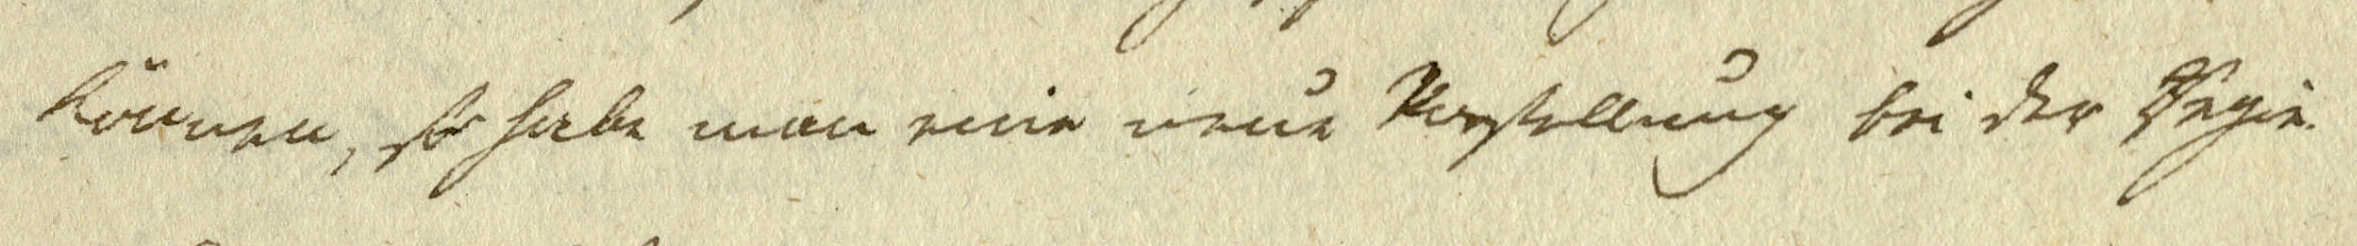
können, so habe man eine neue Vorstellung bei der Regie¬
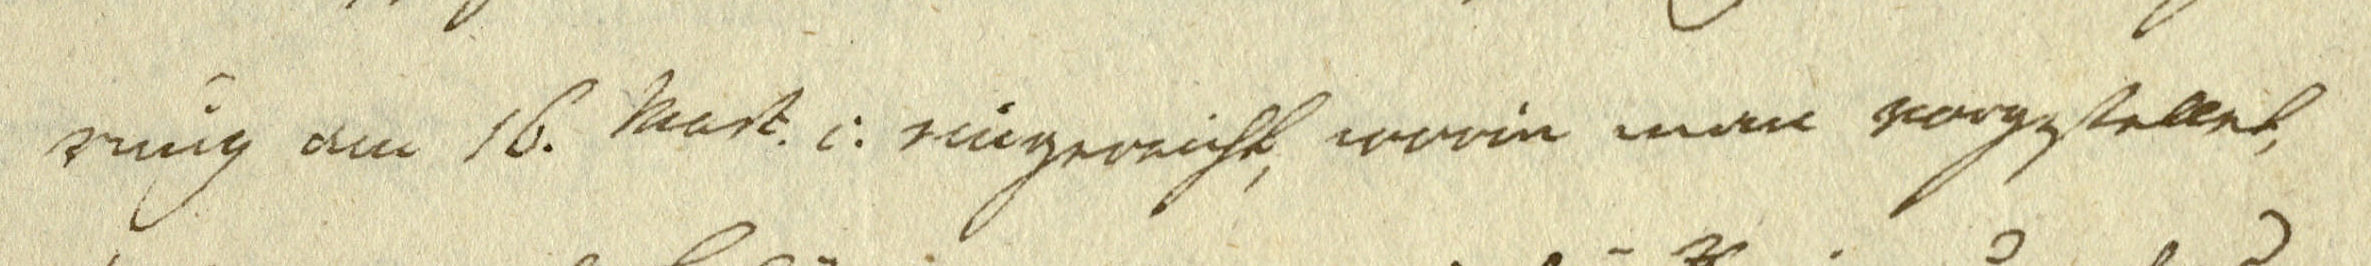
rung am 16. Mart. c. eingereicht, worin man vorgestellet,
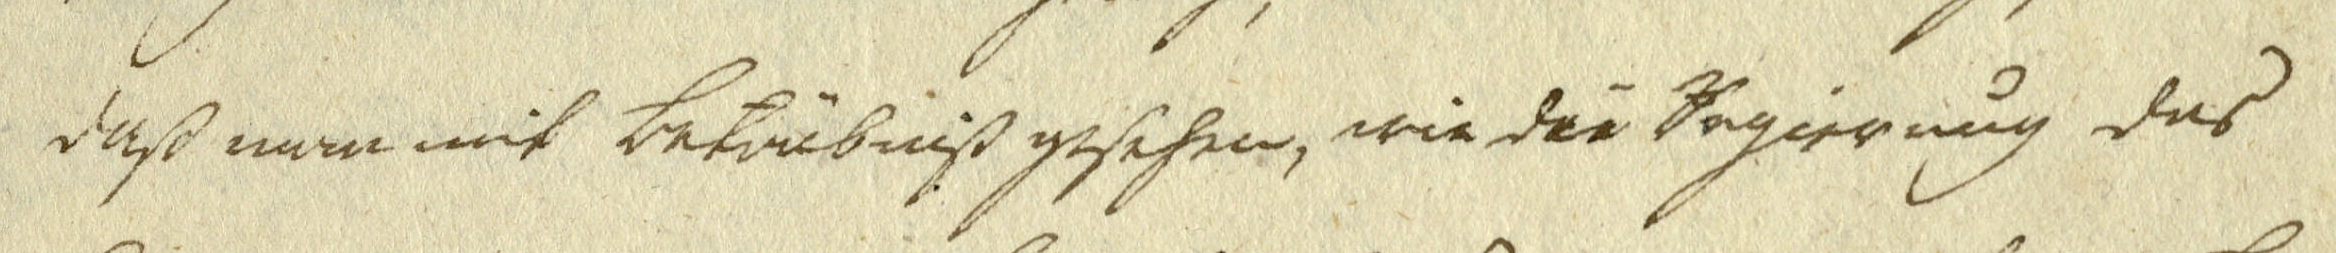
daß man mit Betrübniß gesehen, wie die Regierung das
